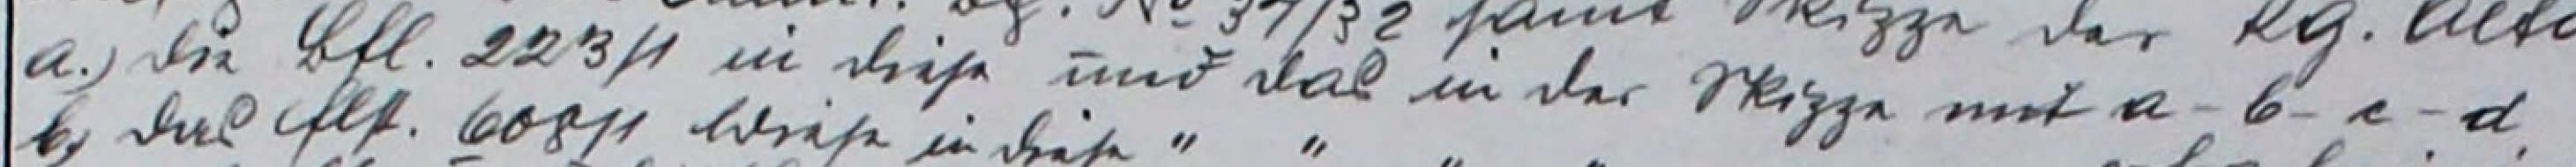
a) Die Bfl. 223/1 in diese und das in der Skizze mit a - b - c - d
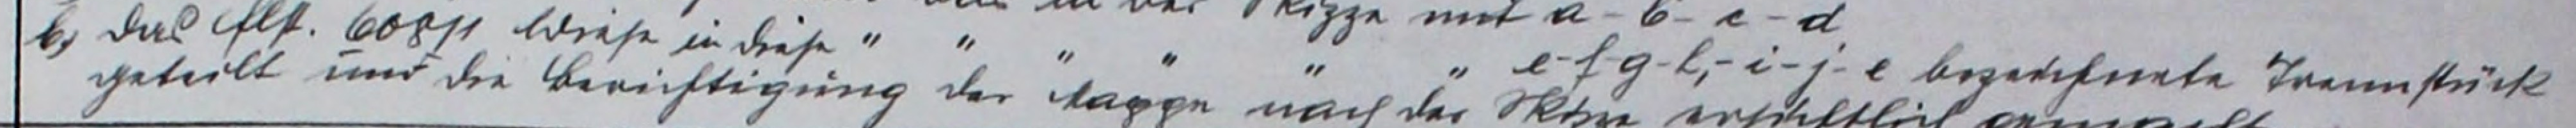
b) Das Flst. 608/1 Wiese in diese „ „ „ „ „ „ e - f - g - h, - i - j - e bezeichnete Trennstück
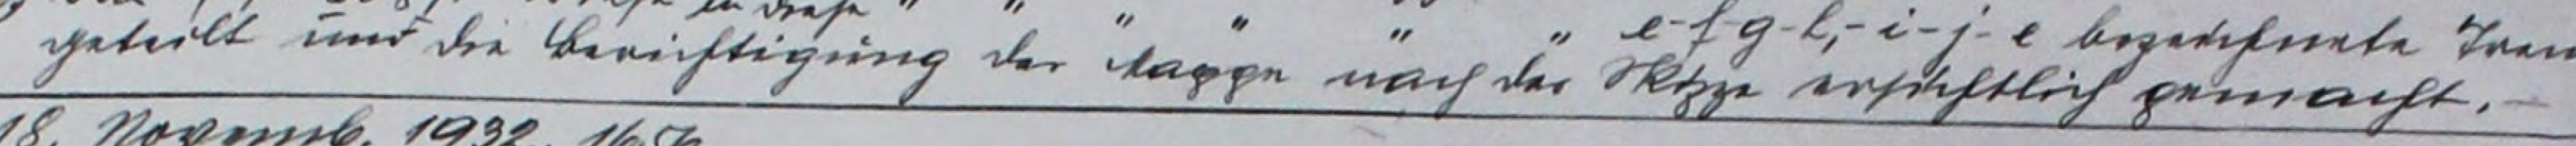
geteilt und die Berichtigung der Mappe nach der Skizze ersichtlich gemacht.
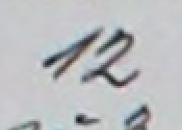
12
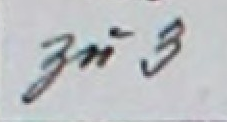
zu 3
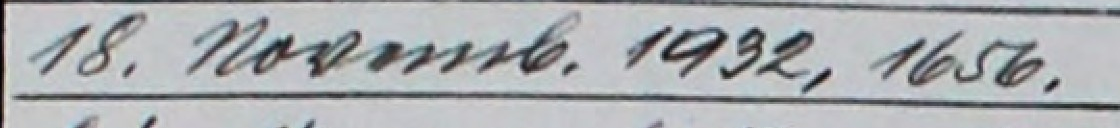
18. Novemb. 1932, 1656.
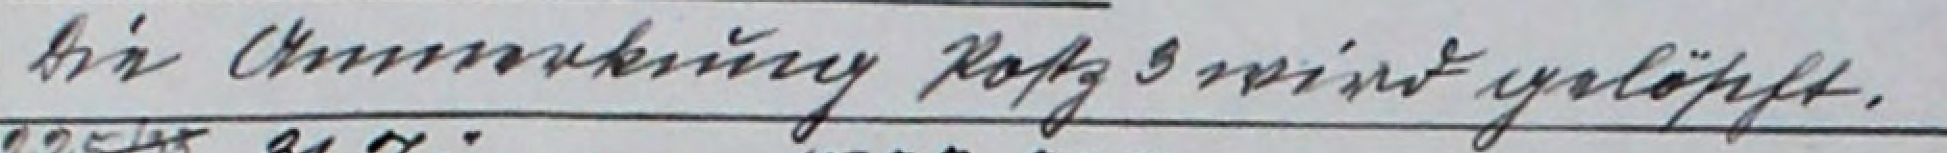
Die Anmerkung Postz 3 wird gelöscht.
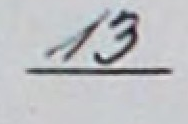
13
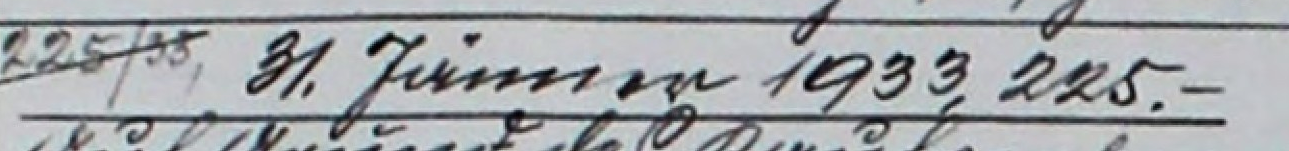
225/35, 31. Jänner 1933, 225. -
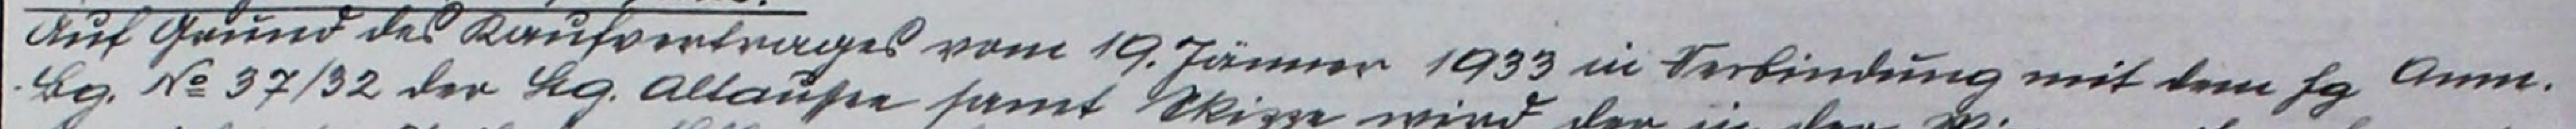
Auf Grund des Kaufvertrages vom 19. Jänner 1933 in Verbindung mit dem hg Anm.
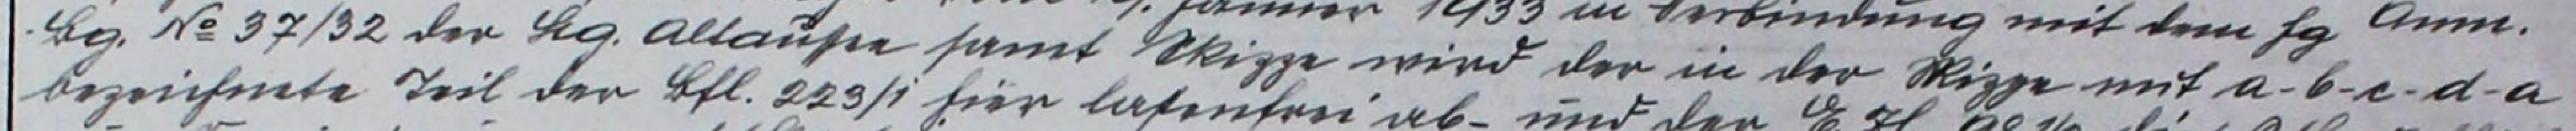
Bg. No 37/32 der Stg. Altaussee samt Skizze wird der in der Skizze mit a - b - c - d - a
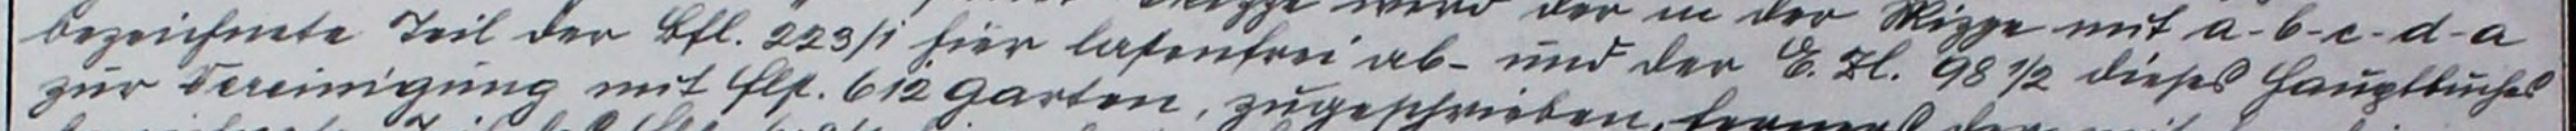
bezeichnete Teil der Bfl. 223/1 hier lastenfrei ab- und der E.Zl. 98 1/2 dieses Hauptbuches
